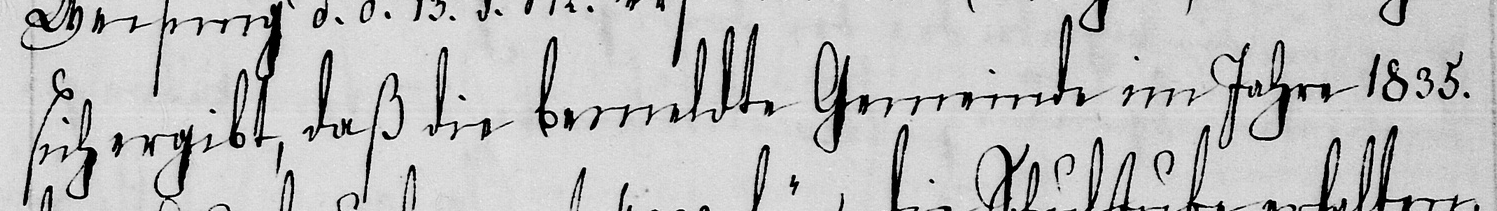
sich ergibt, daß die bemeldte Gemeinde im Jahre 1835.
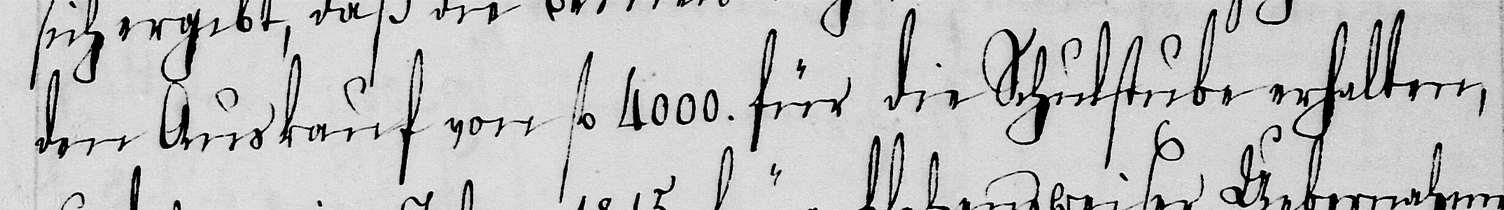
den Auskauf von fl. 4000. für die Schulstube erhalten,
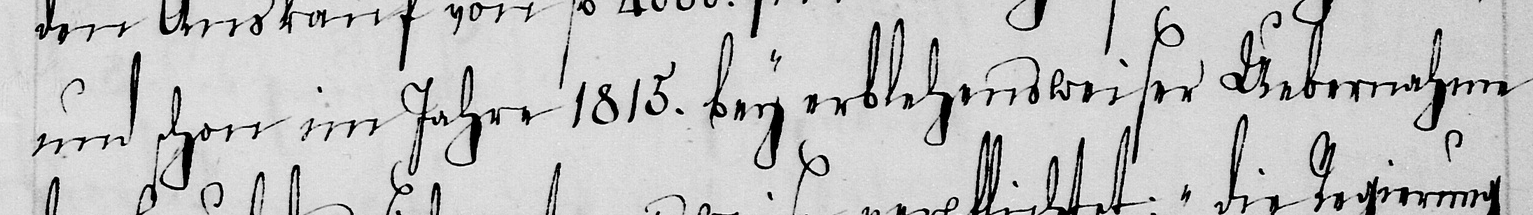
und schon im Jahre 1815. bey erblehensweiser Uebernahme
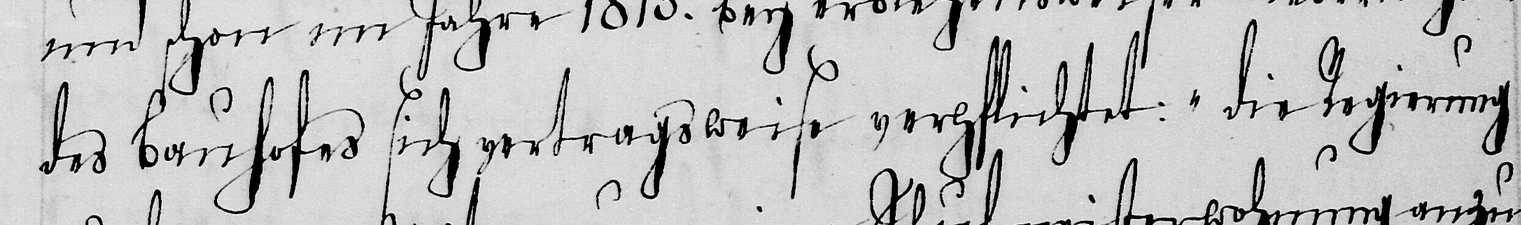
des Bauhofes sich vertragsweise verpflichtet: „die Regierung
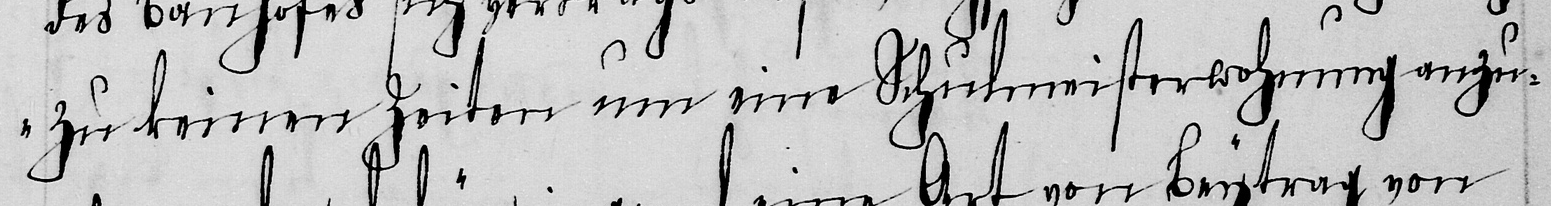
zu keinen Zeiten um eine Schulmeisterwohnung anzu¬
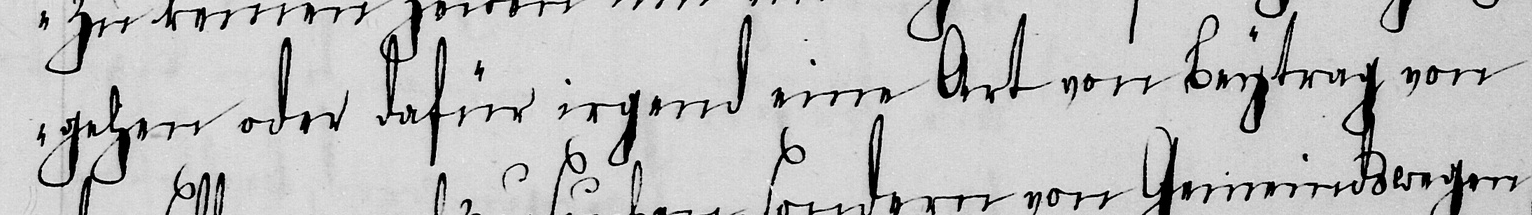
gehen oder dafür irgend eine Art von Beytrag von
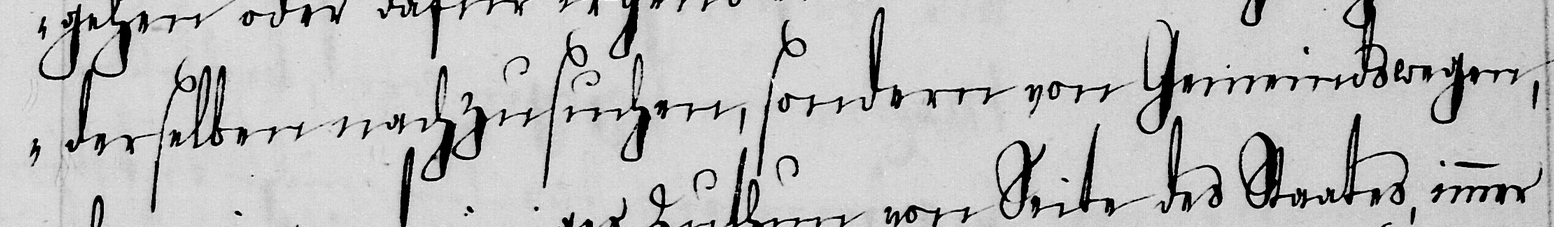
derselben nachzusuchen, sondern von Gemeindswegen,
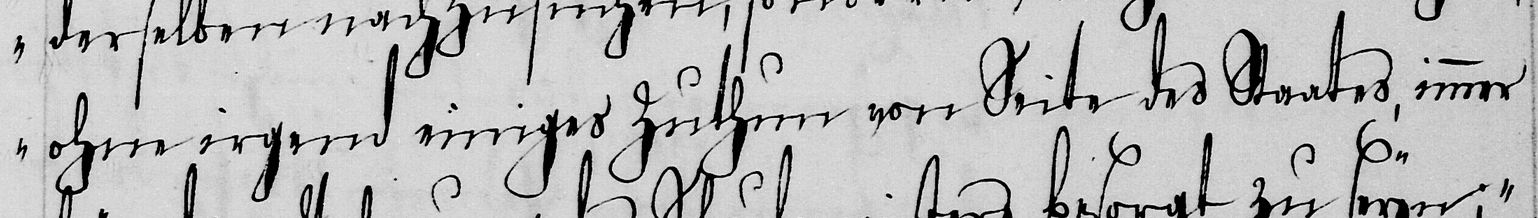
ohne irgend einiges Zuthun von Seite des Staates, immer
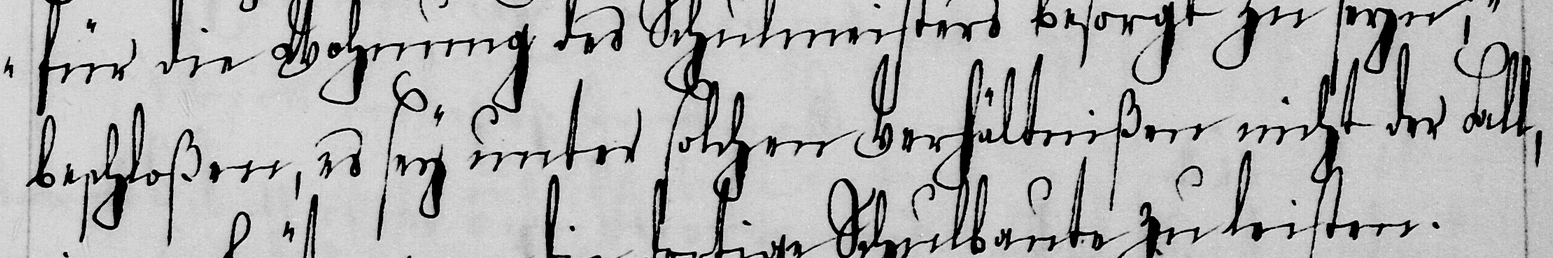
eschloßen, es sey unter solchen Verhältnißen nicht der Fal¬
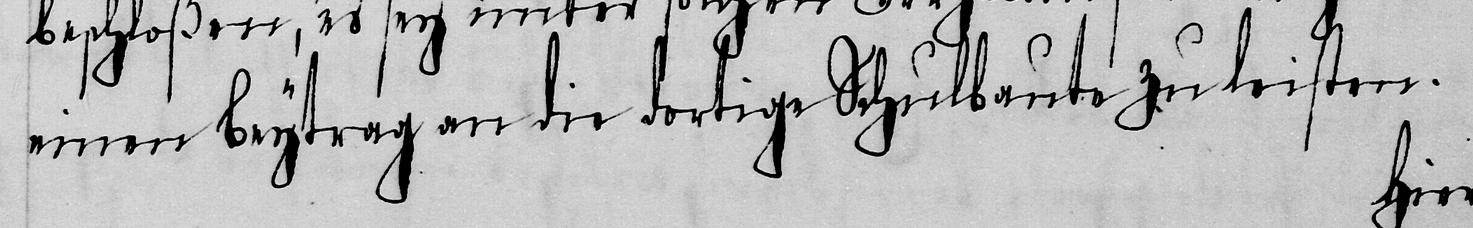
einen Beytrag an die dortige Schulbaute zu leisten.
